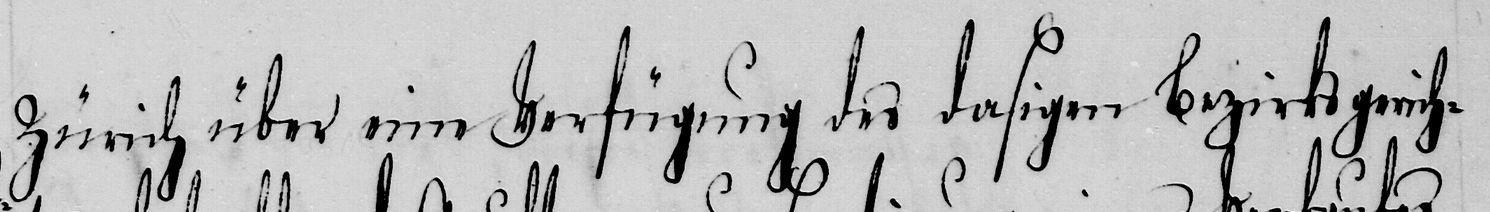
Zürich über eine Verfügung des dasigen Bezirksgerich¬
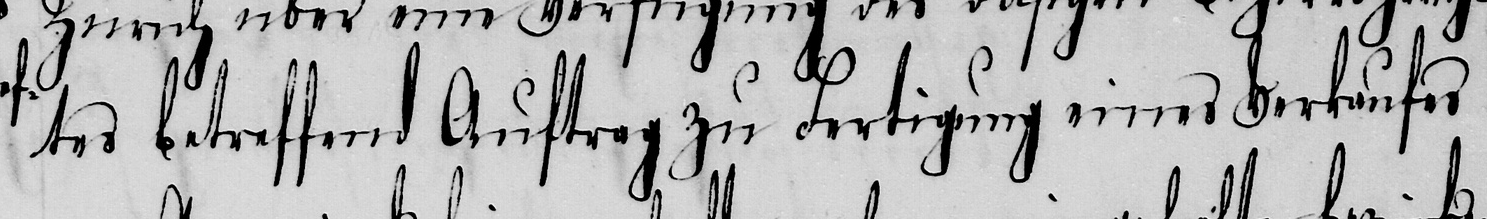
tes betreffend Auftrag zu Fertigung eines Verkaufes
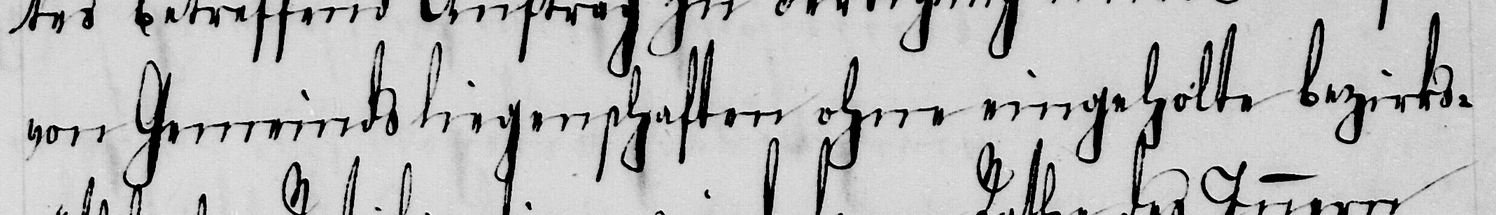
von Gemeindsliegenschaften ohne eingeholte bezirks¬
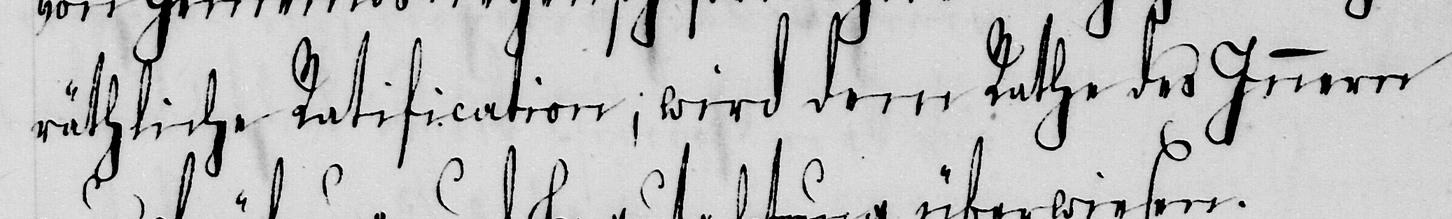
räthliche Ratification; wird dem Rathe des Innern
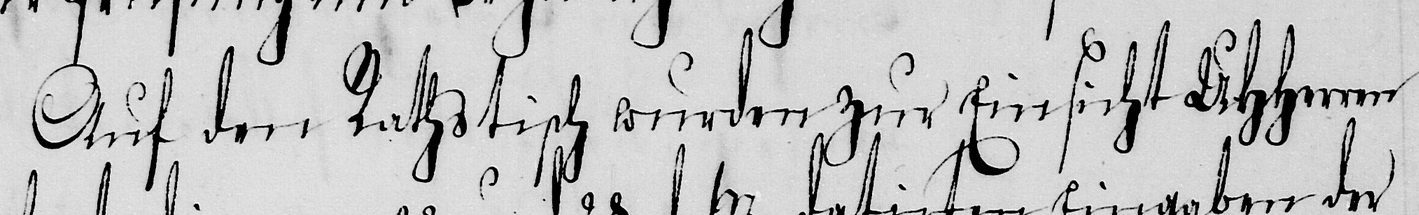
Auf den Rathstisch wurden zur Einsicht UHHerren
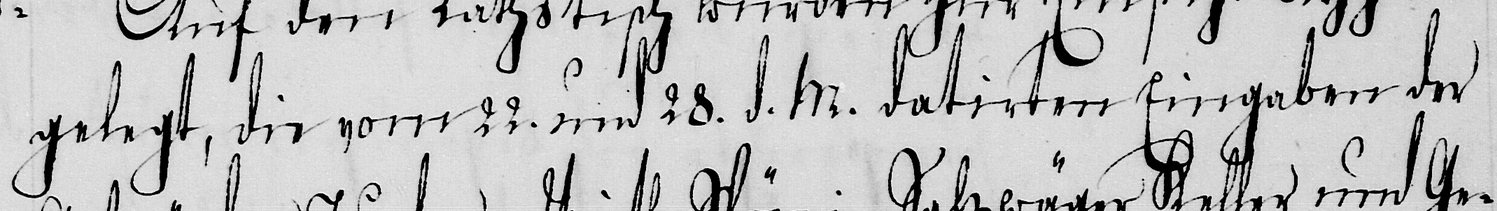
gelegt, die vom 22. und 28. d. M. datirten Eingaben der
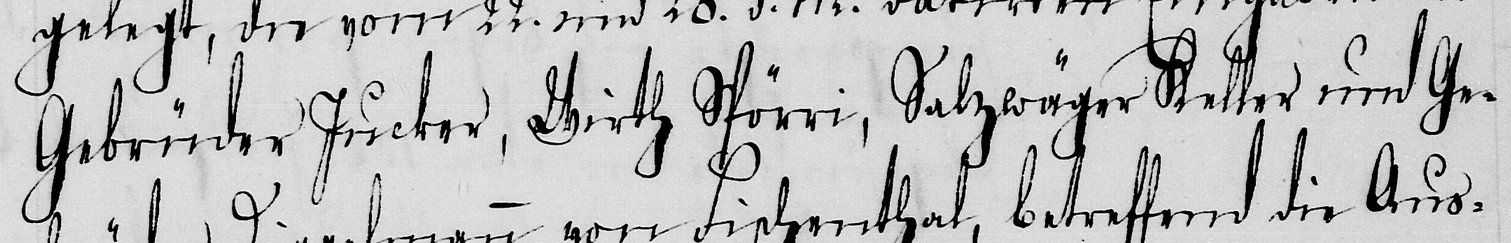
Gebrüder Jucker, Wirth Spörri, Salzwäger Keller und Ge¬
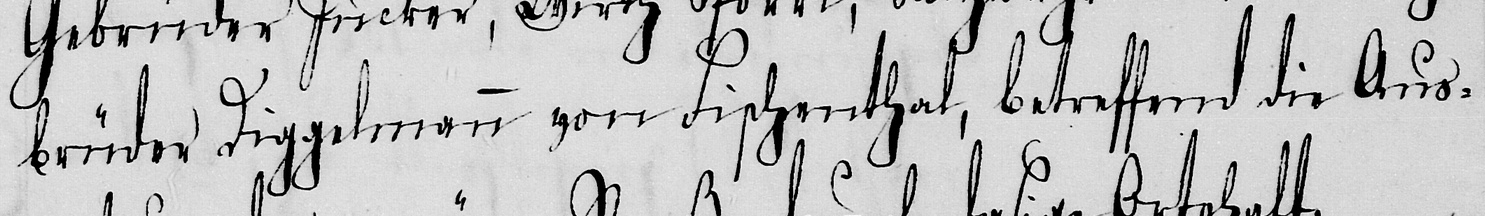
brüder Diggelmann von Fischenthal, betreffend die Aus¬
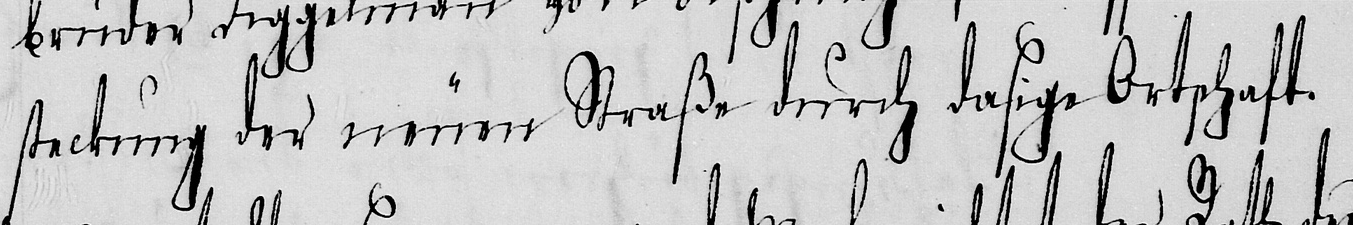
steckung der neuen Straße durch dasige Ortschaft.
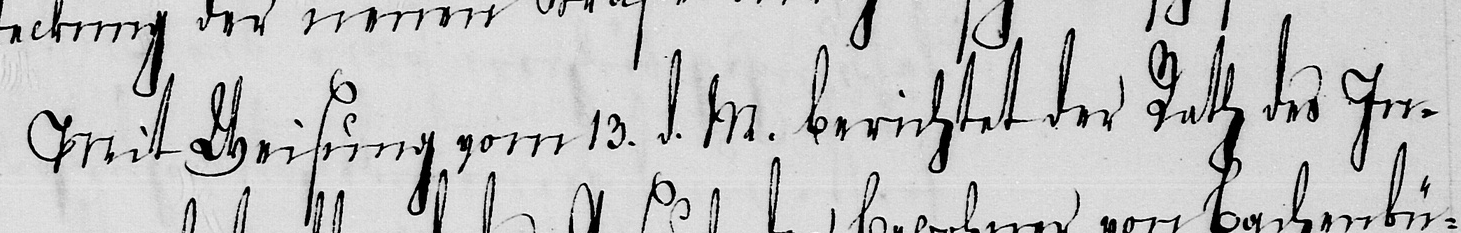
Mit Weisung vom 13. d. M. berichtet der Rath des In¬
